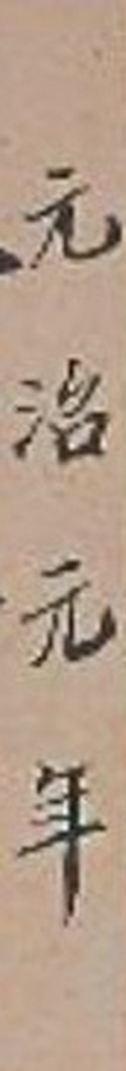元治元年
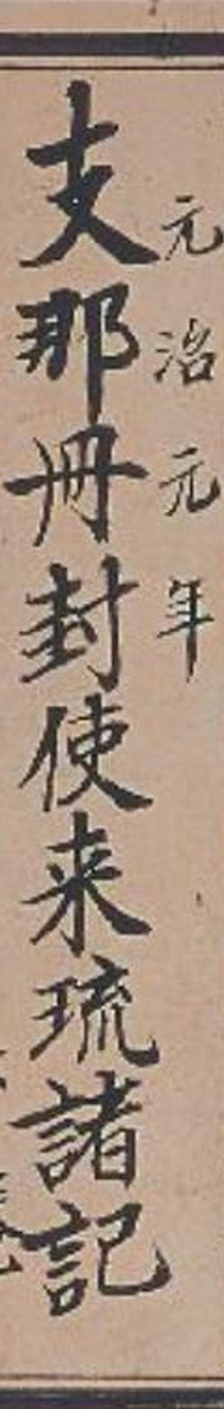支那冊封使来琉諸記

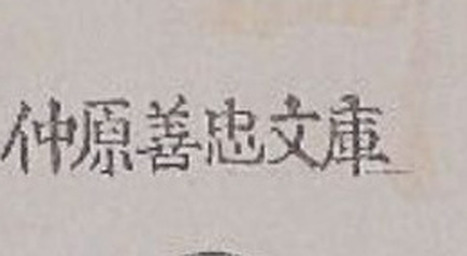仲原善忠文庫
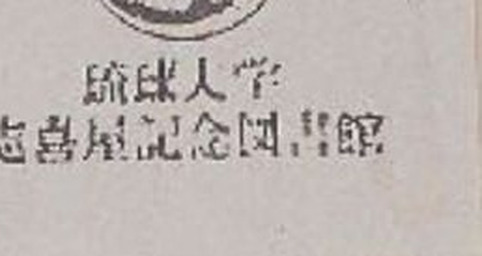志喜屋記念図書館
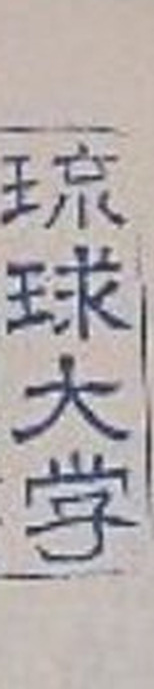琉球大学
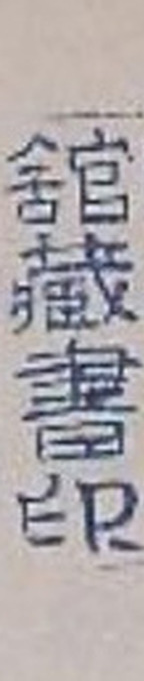【蔵書印

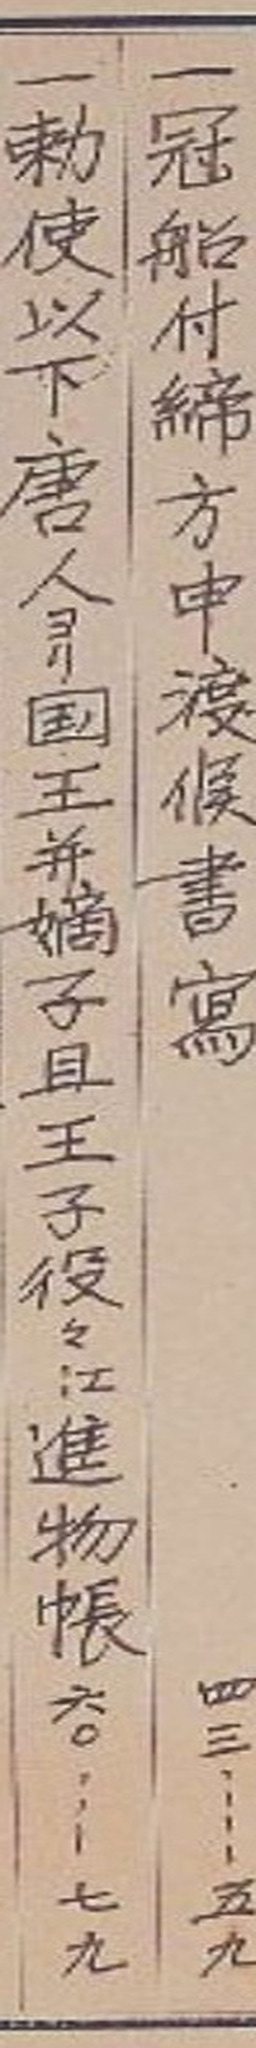一勅使以下唐人より国王并嫡子且王子役々え進物帳六〇・・・・七九
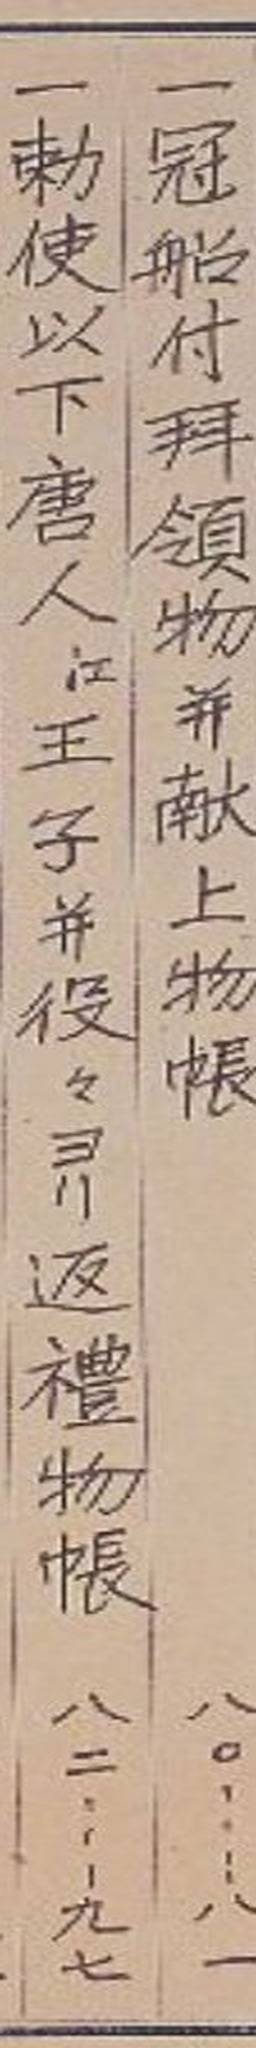一勅使以下唐人え王子并役々より返礼物帳八二・・・・九七

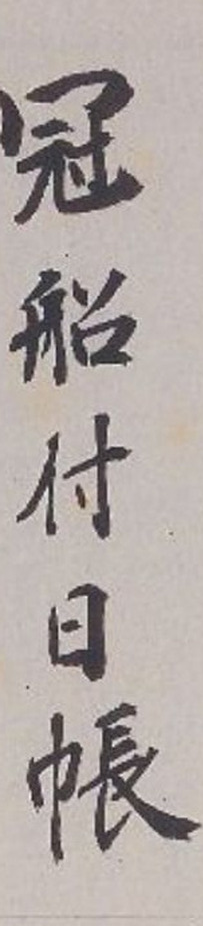冠船付日帳

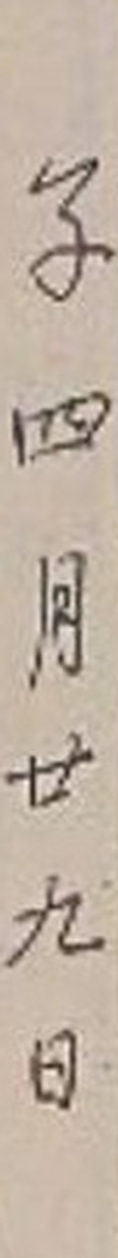子四月廿九日
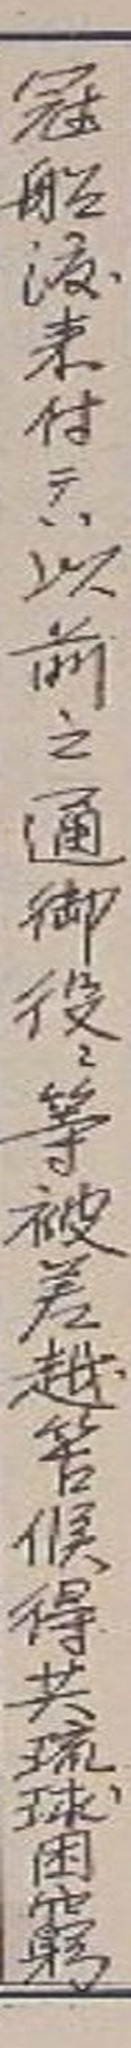冠船渡来付ては以前之通御役々等被差越筈候得共琉球困窮
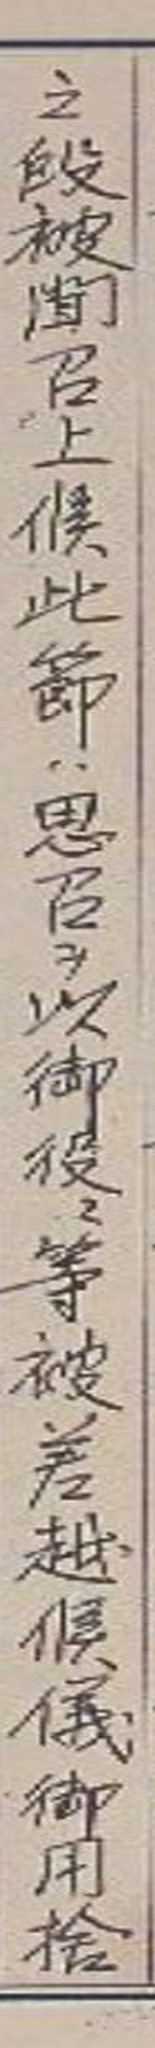之段被聞召上候此節は思召を以御役々等被差越候儀御容捨
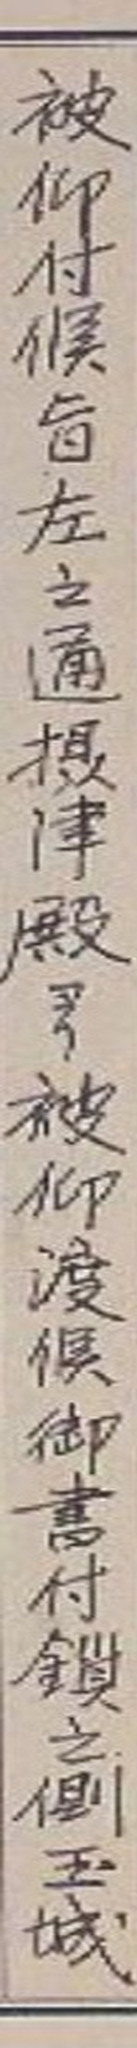被仰付候旨左之通摂津殿より被仰渡候御書付鎖之側玉城
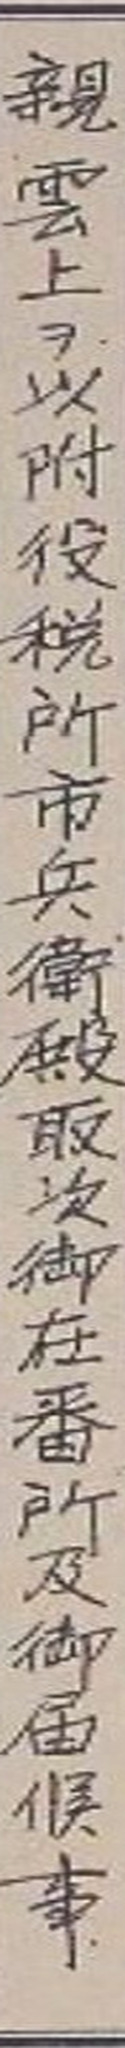親雲上を以附役税所市兵衛殿取次御在番所及御届候事
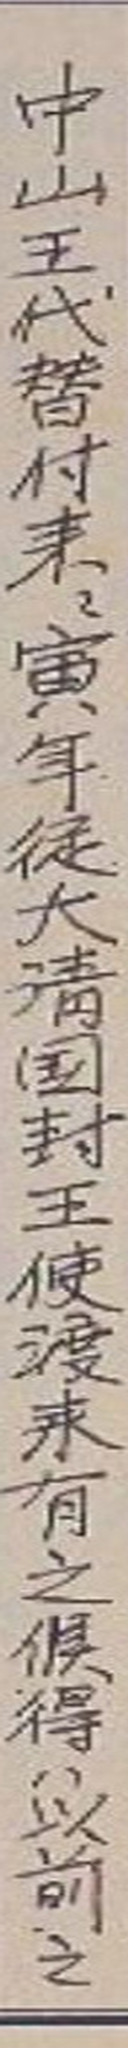中山王代替付来々寅年従大清国封王使渡来有之候得は以前之
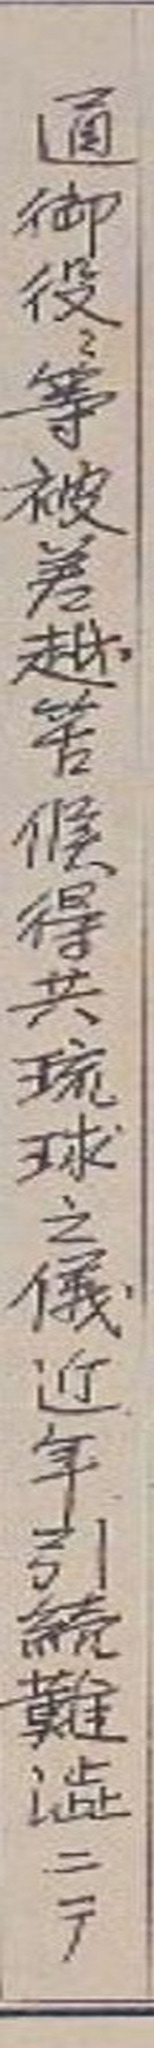通御役々等被差越筈候得共琉球之儀近年引続難渋にて
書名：支那冊封使来琉諸記 下巻
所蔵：University of the Ryukyus Library
